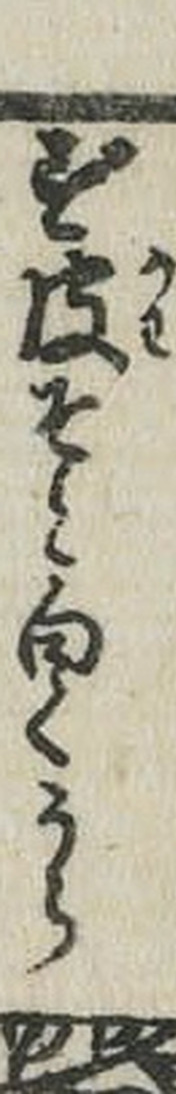ず皮そと向くうら
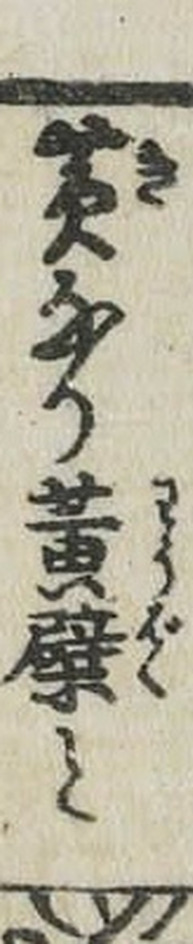黄なり黄檗と
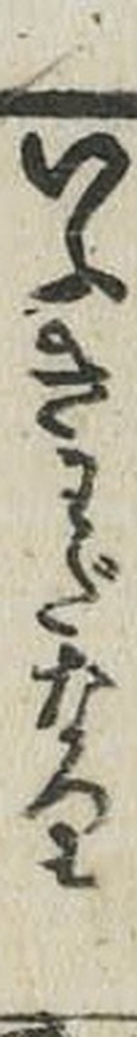いふきわだなり
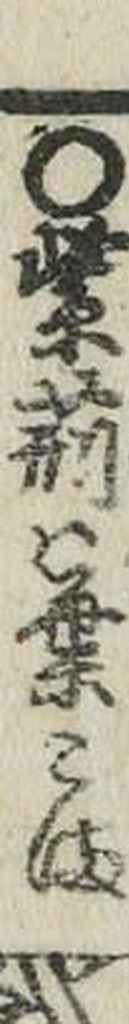○紫荊は葉こま
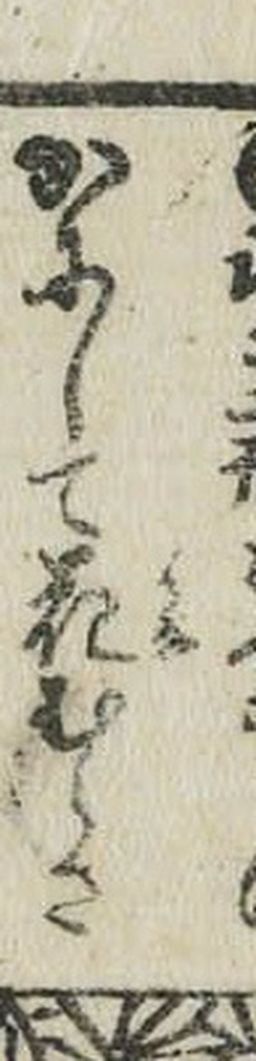かにして花むらさ
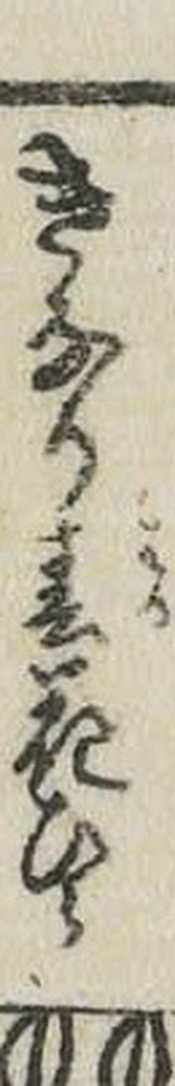きなり春花ひら
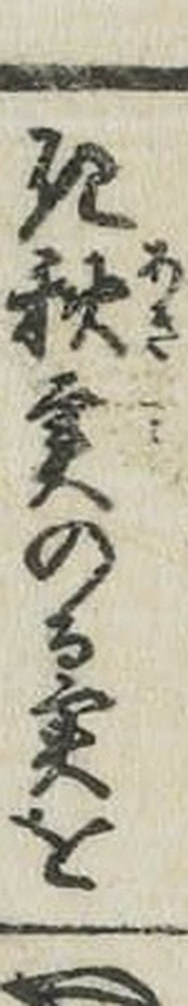き秋実のる実を
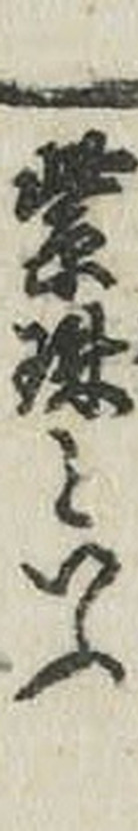紫珠といふ
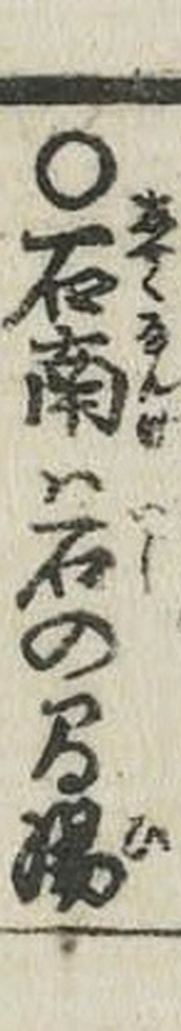○石南は石の間陽
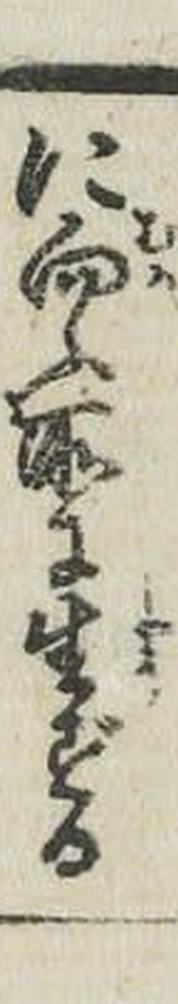に向ふ所に生ずる
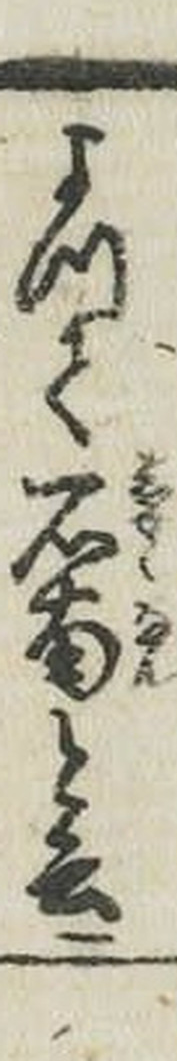よつて石南と云
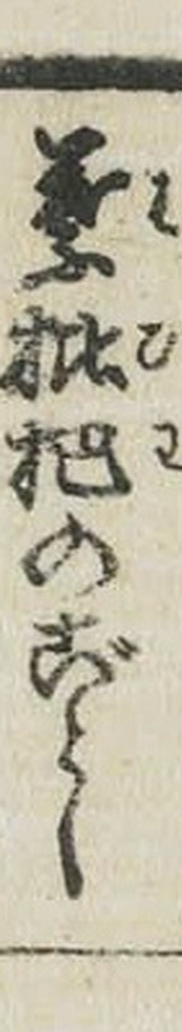葉枇杷のごとし
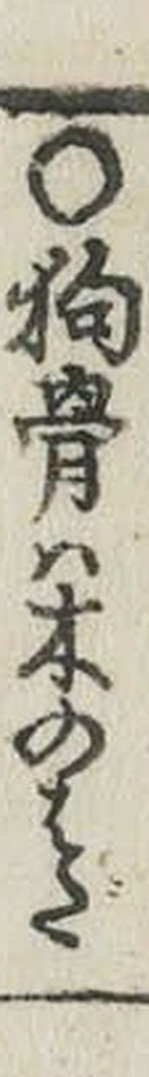○狗骨は木のはだ
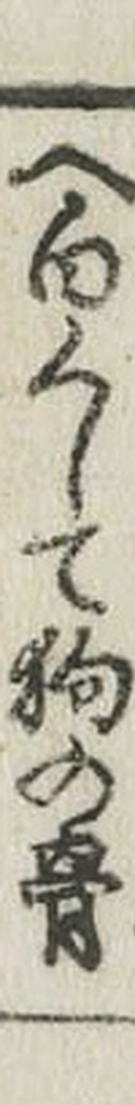へ白くして狗の骨
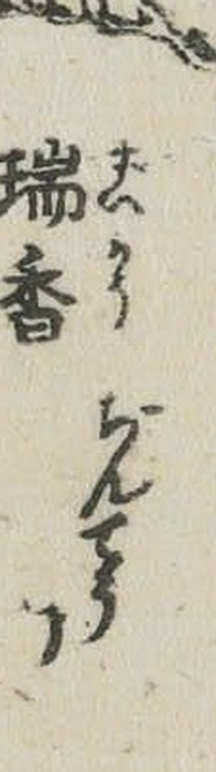瑞香ぢんてうけ
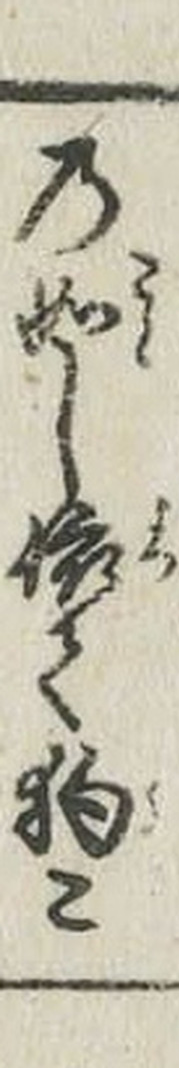の如し依て狗こ
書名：増補頭書訓蒙図彙大成 10巻 8:巻之17-19
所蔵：東京学芸大学教育コンテンツアーカイブ
